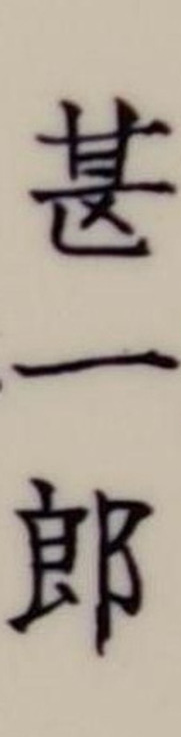甚一郎
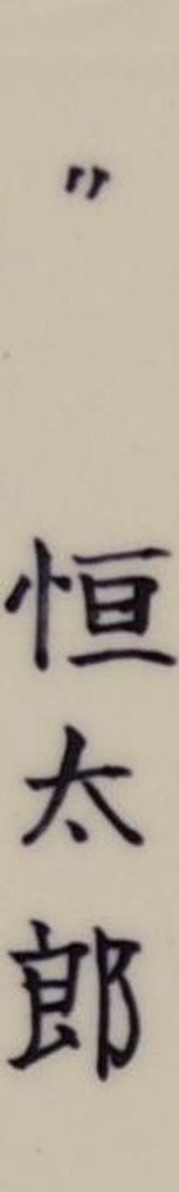恒太郎
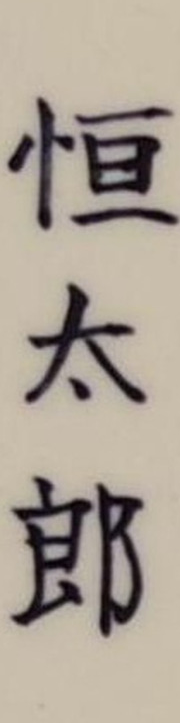恒太郎
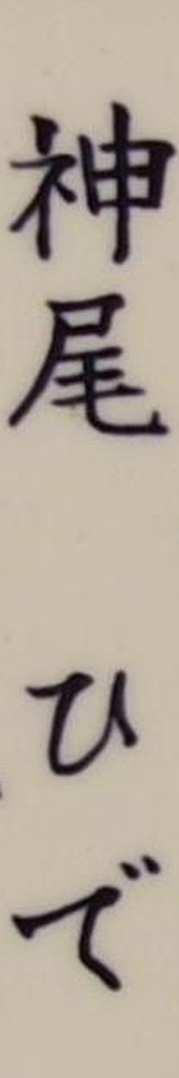神尾ひで

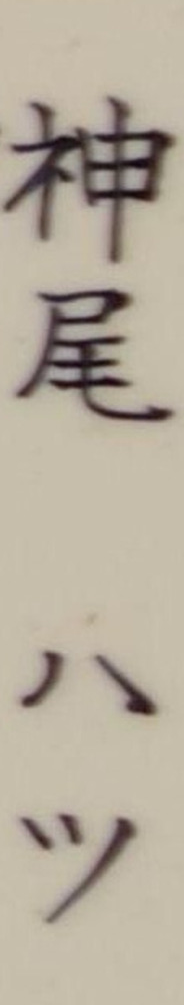神尾ハツ
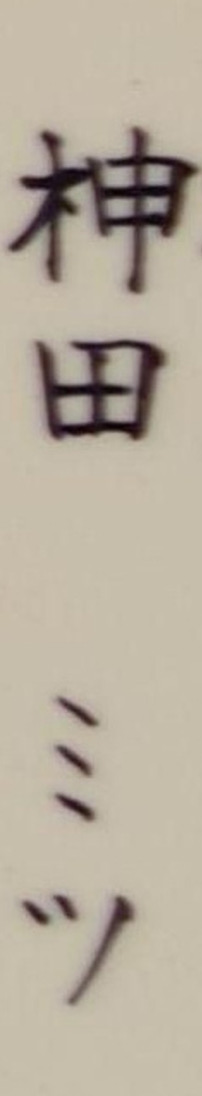神田ミツ
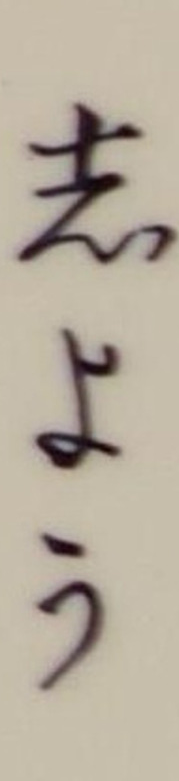しよう
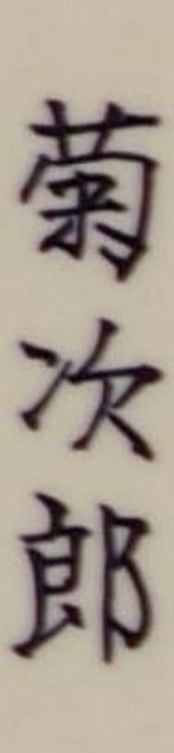菊次郎
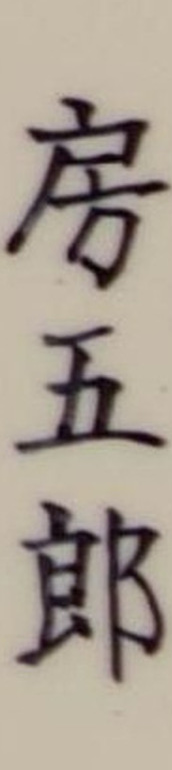房五郎
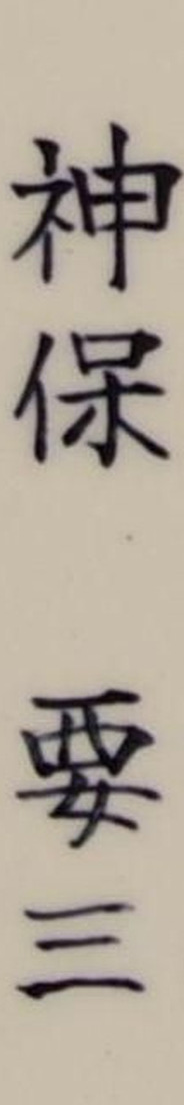神保要三
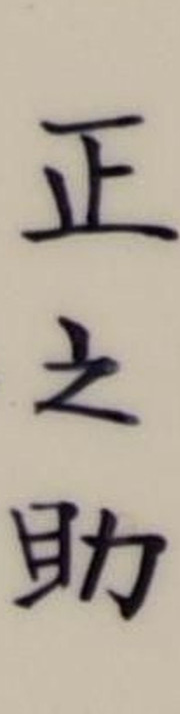正之助
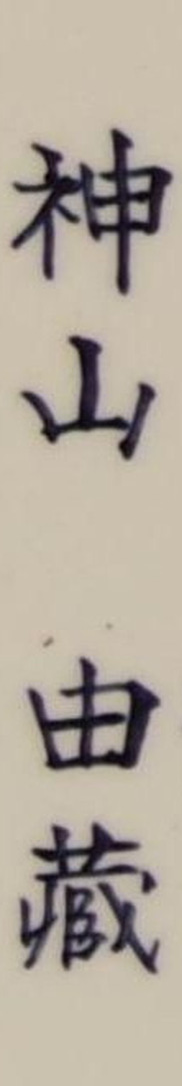神山由蔵

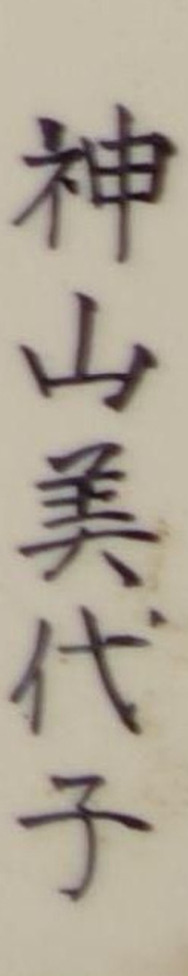神山美代子
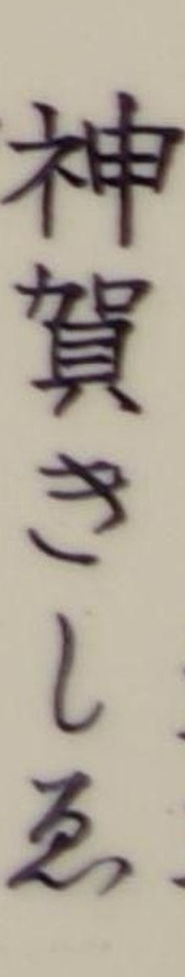神賀きしゑ
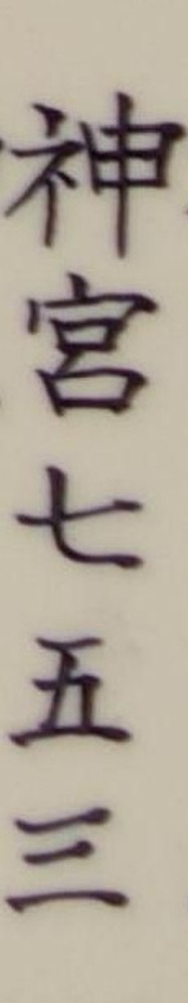神宮七五三
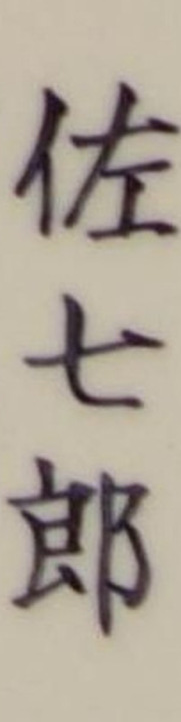佐七郎
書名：M~S
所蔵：高野山金剛峯寺
